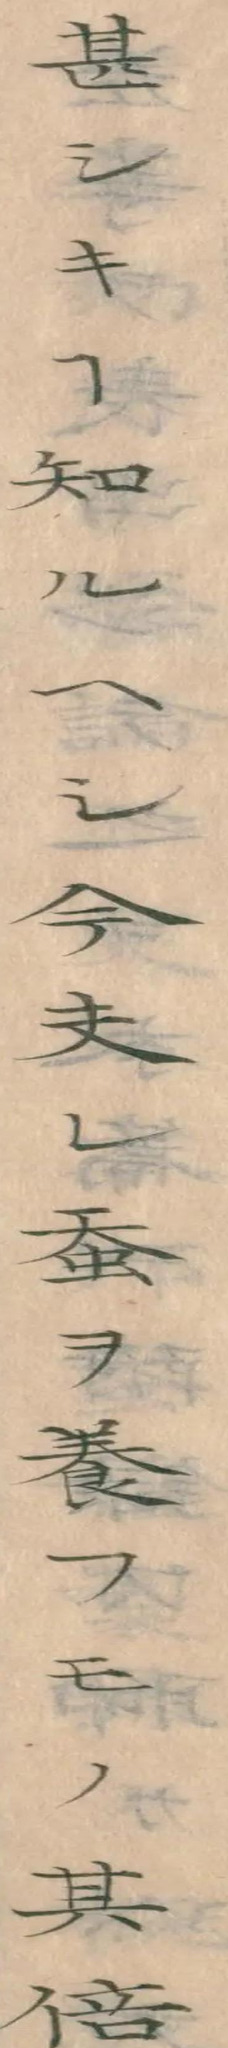甚シキコト知ルヘシ今夫レ蚕ヲ養フモノ其倍
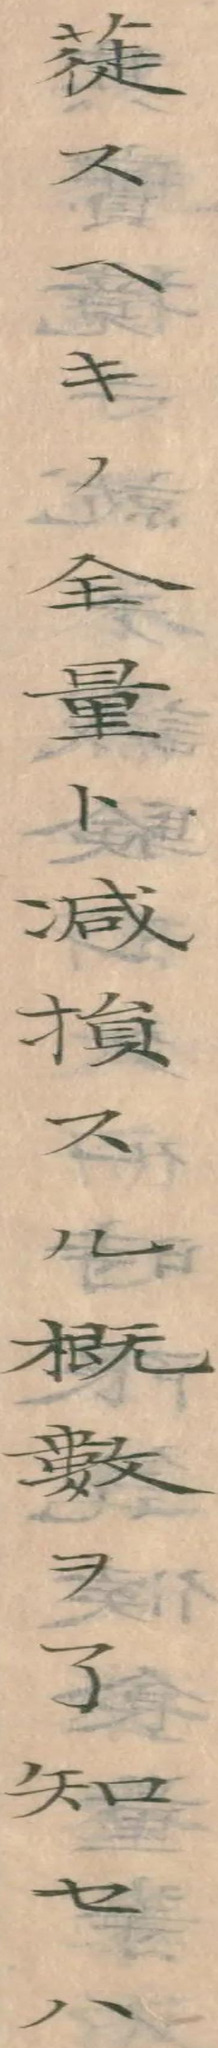蓯スヘキノ全量ト減損スル概数ヲ了知セハ
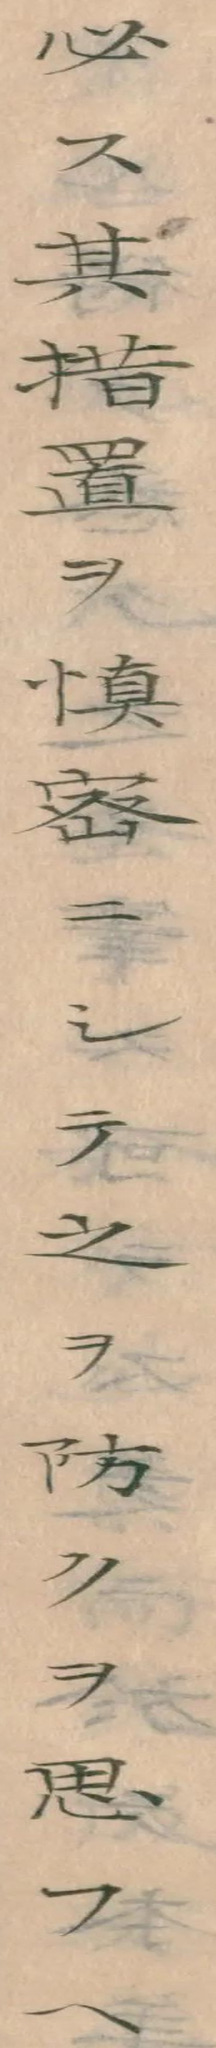必ス其措置ヲ慎密ニシテ之ヲ防クヲ思フヘ
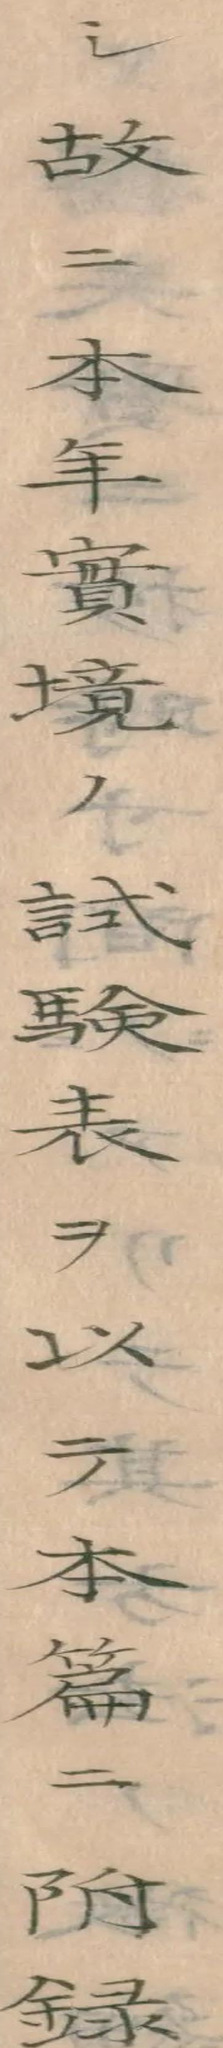シ故ニ本年実境ノ試験表ヲ以テ本篇ニ附録
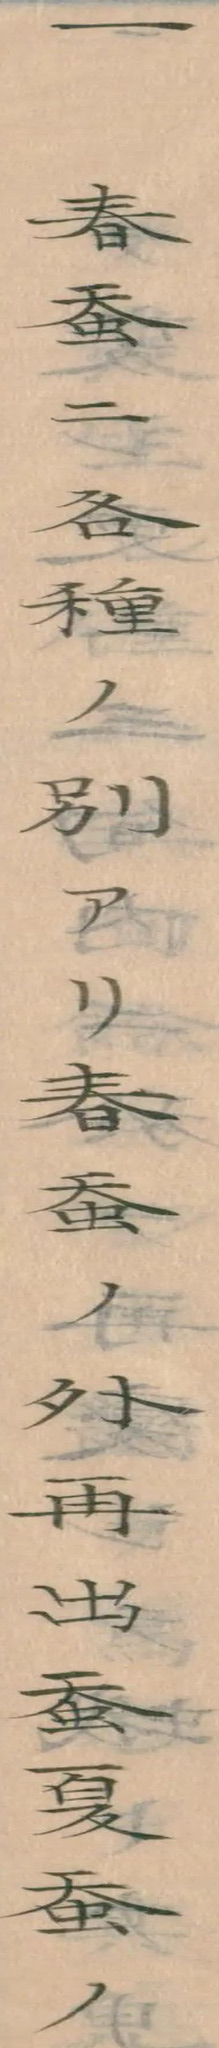一春蚕ニ各種ノ別アリ春蚕ノ外再出蚕夏蚕ノ
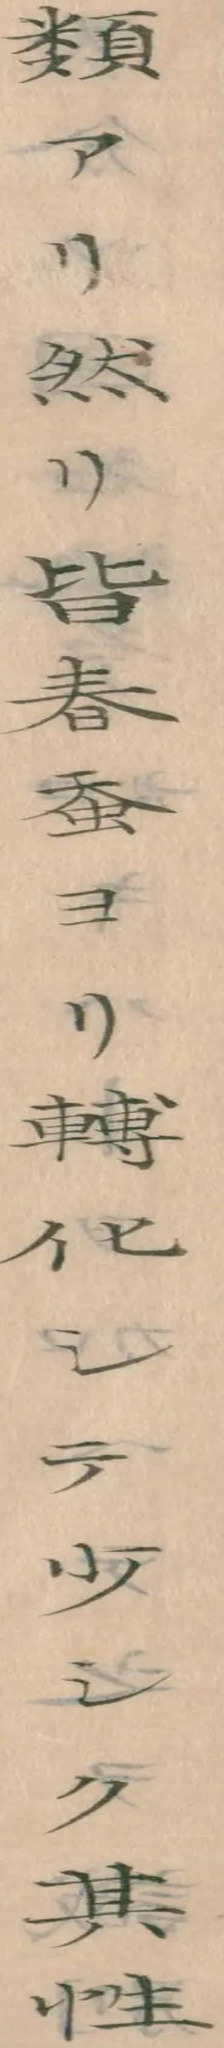類アリ然リ皆春蚕ヨリ転化シテ少シク其性
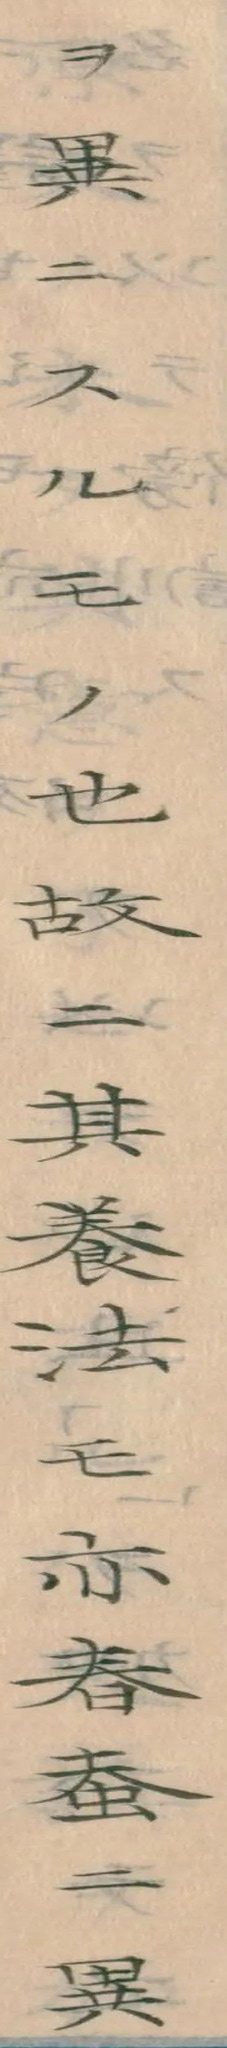ヲ異ニスルモノ也故ニ其養法モ亦春蚕ニ異
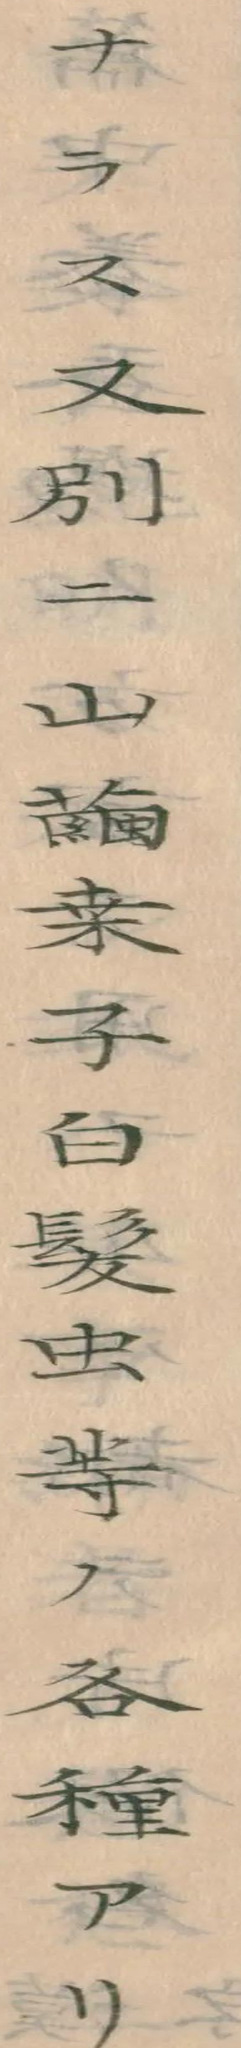ナラス又別ニ山繭桑子白髪虫等ノ各種アリ
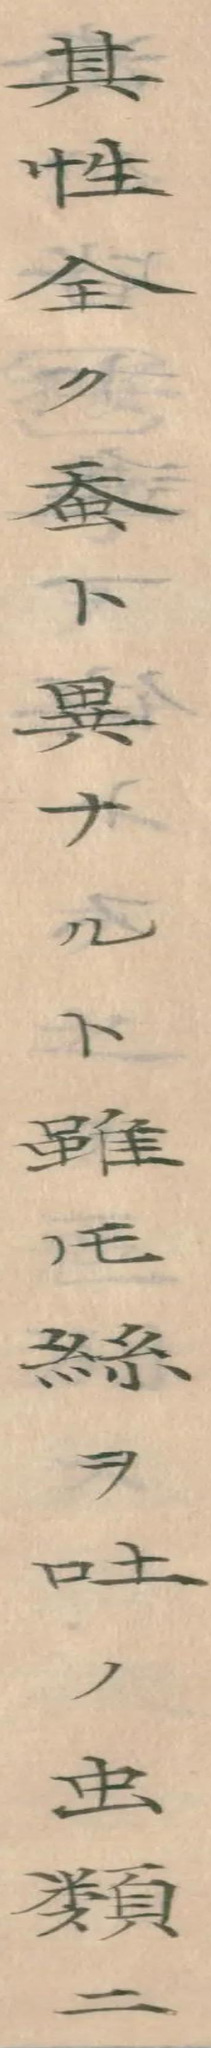其性全ク蚕ト異ナルト雖トモ糸ヲ吐ノ虫類ニ
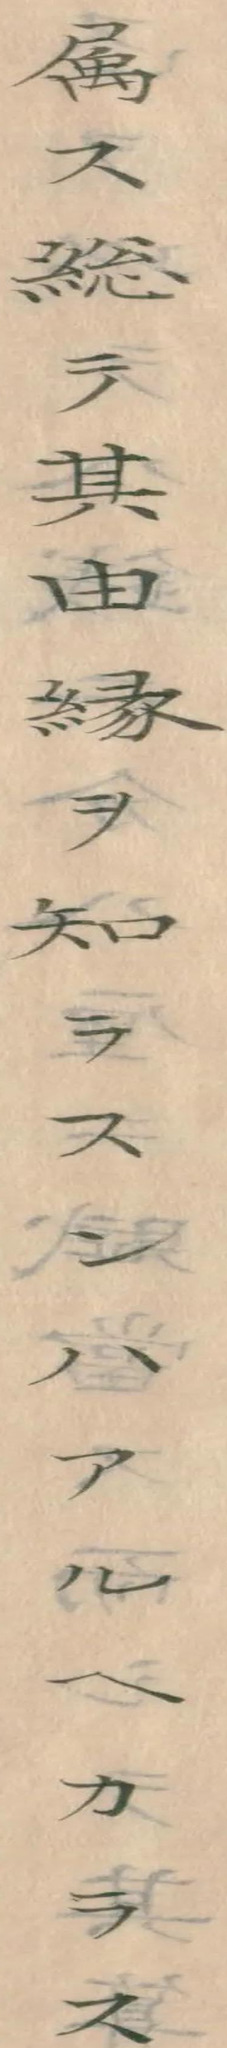属ス総テ其由縁ヲ知ラスンハアルヘカラス
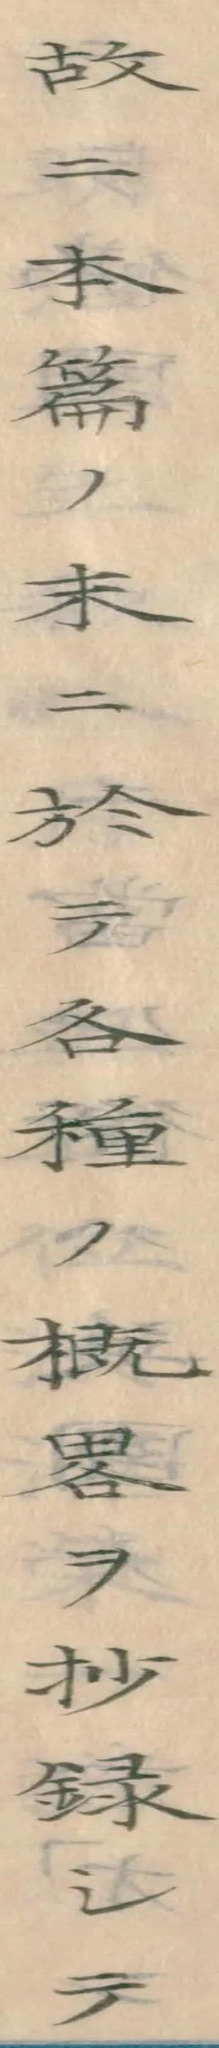故ニ本篇ノ末ニ於テ各種ノ概略ヲ抄録シテ
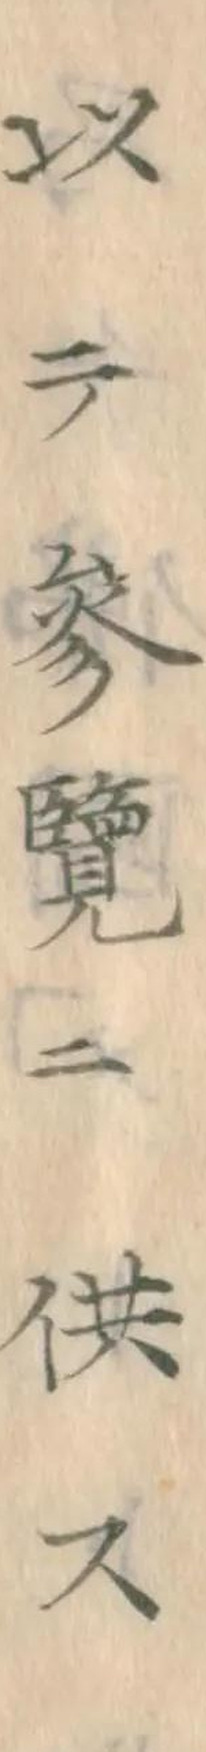以テ参覧ニ供ス
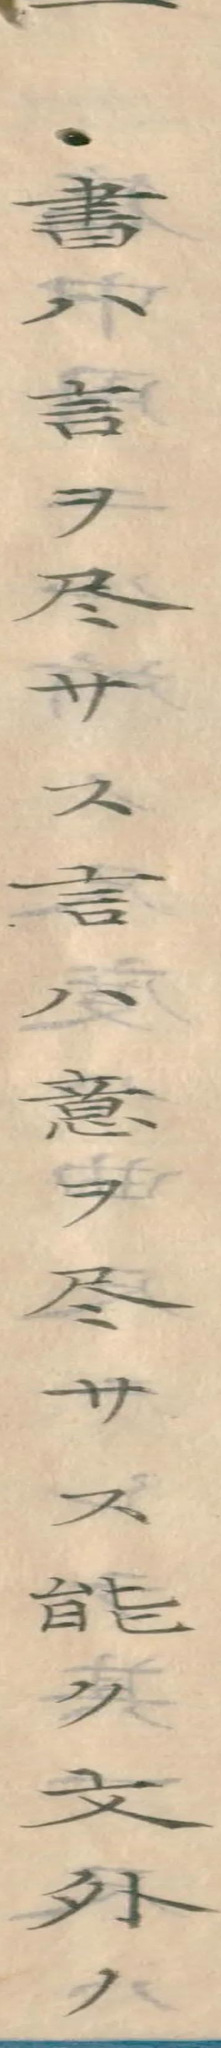一書ハ言ヲ尽サス言ハ意ヲ尽サス能ク文外ノ
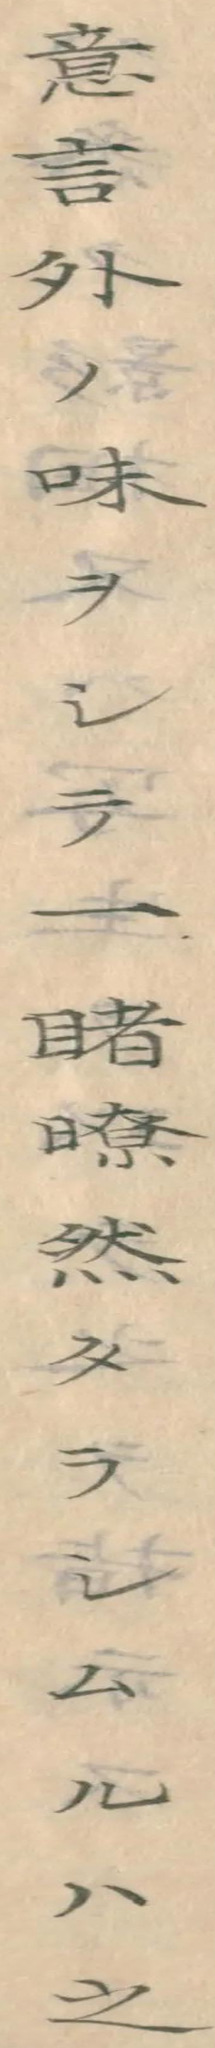意言外ノ味ヲシテ一睹瞭然タラシムルハ之

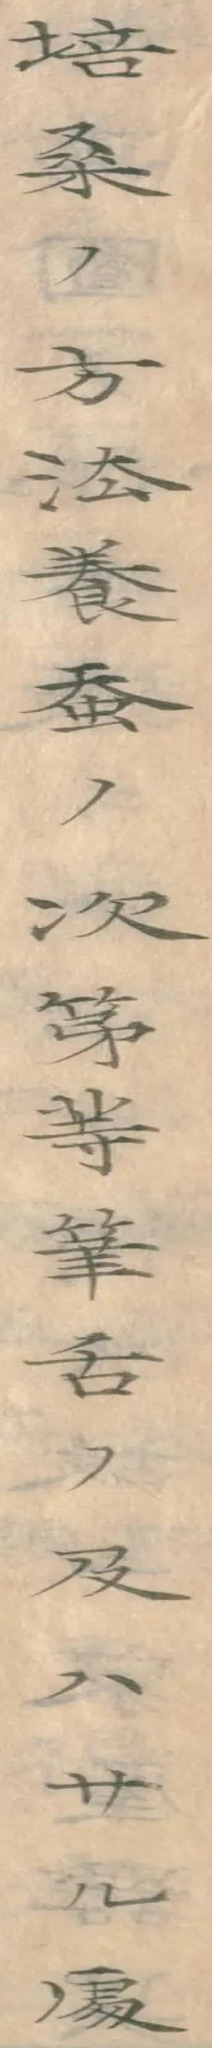培桑ノ方法養蚕ノ次第等筆舌ノ及ハサル処
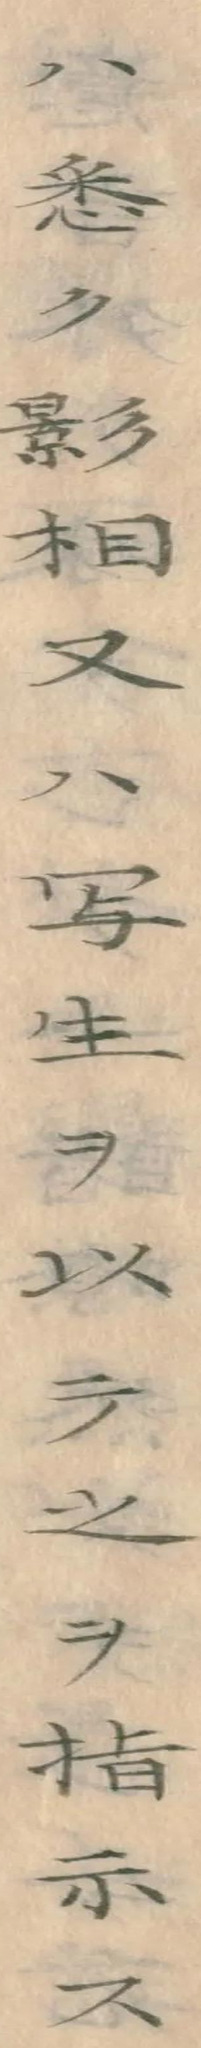ハ悉ク影相又ハ写生ヲ以テ之ヲ指示ス
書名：蚕桑集成
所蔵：国立国会図書館 National Diet Library, JAPAN
